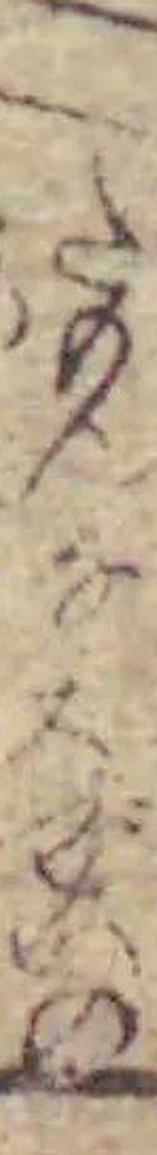たもんな大ぜいの
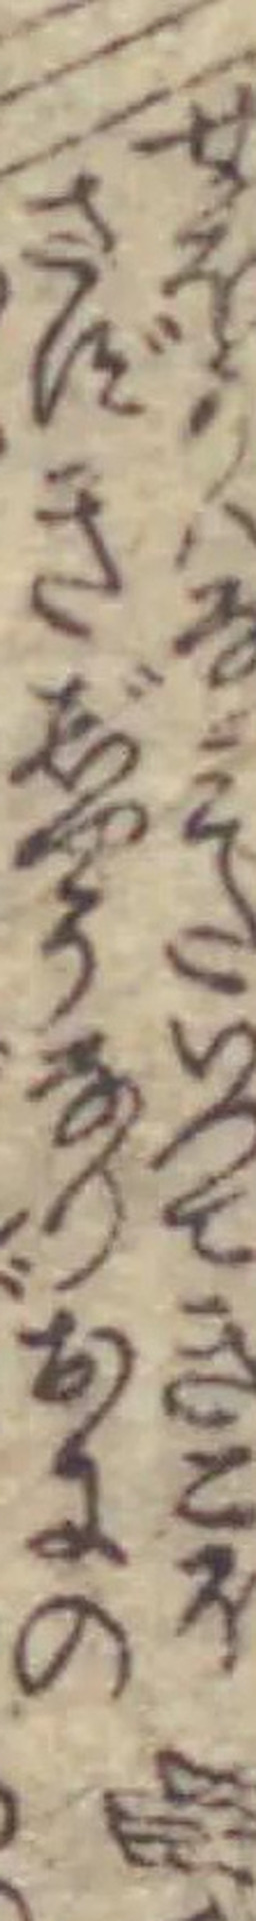さずきじやうなりおにの
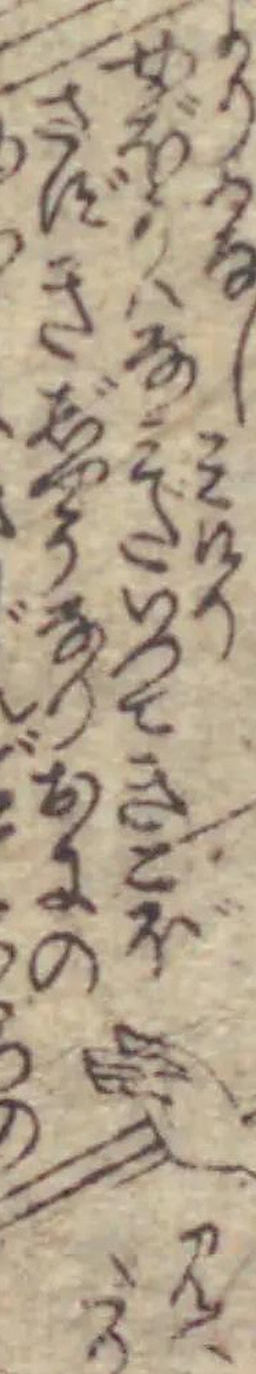さずきじやうなりおにの
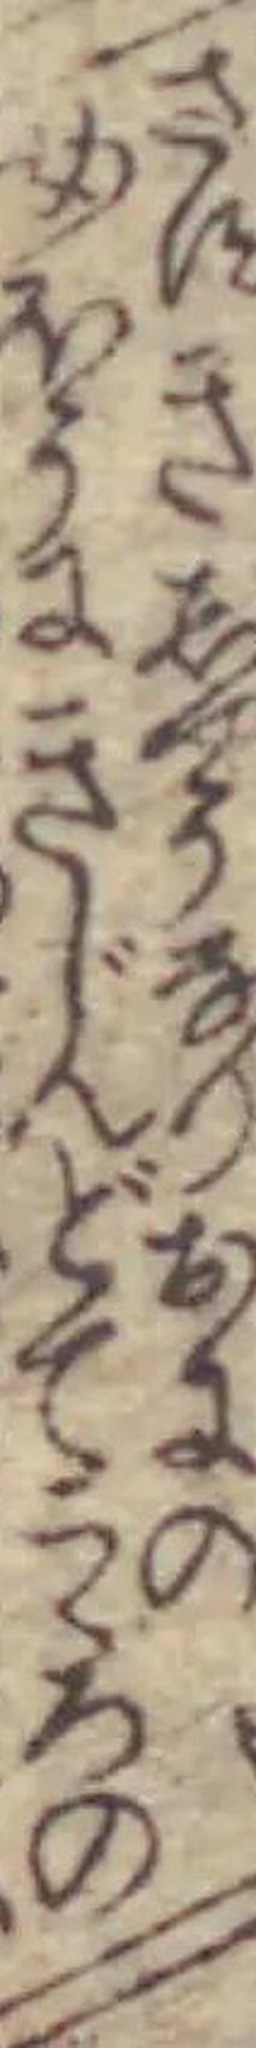女ほうにきじんどてこゝろの
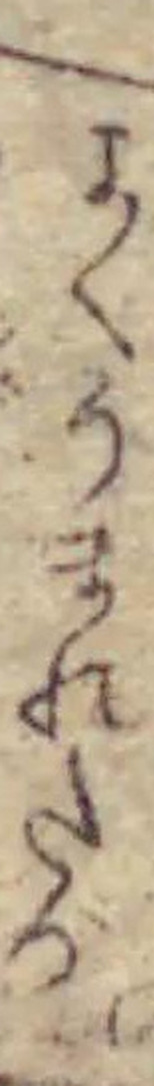よくうまれたが
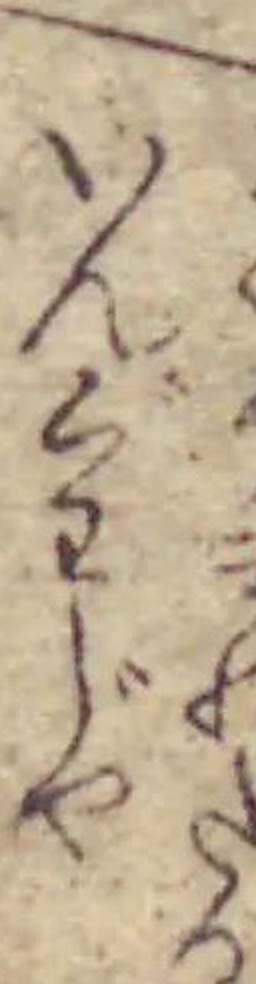いんぐわじや
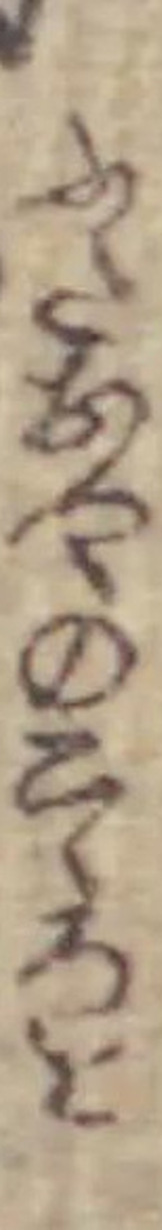ふたおやのこゝろを
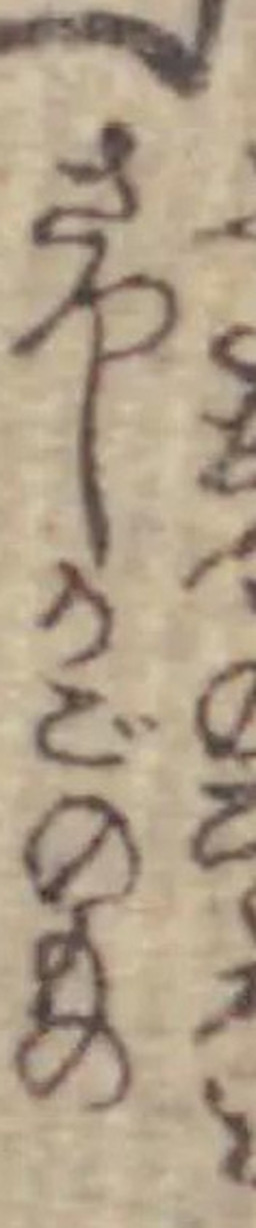さつしかごのもの
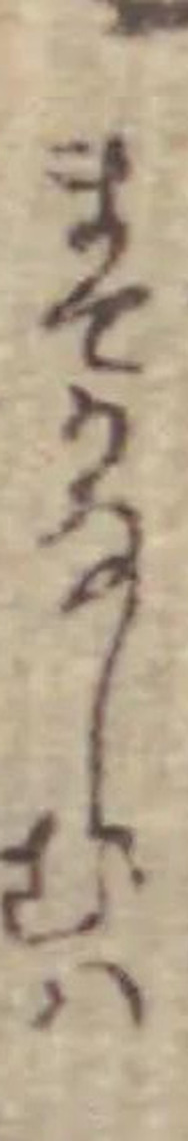まてかなしむは
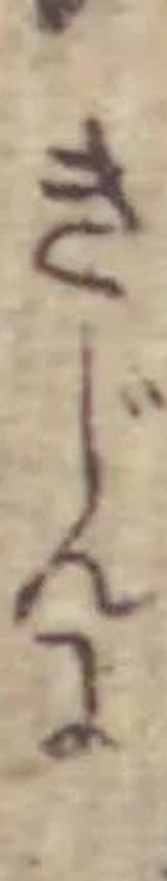きじんに
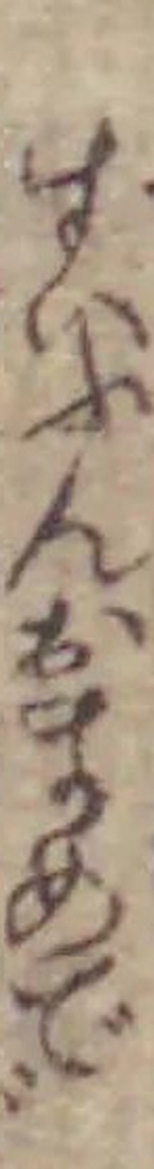ずいふんおまめで
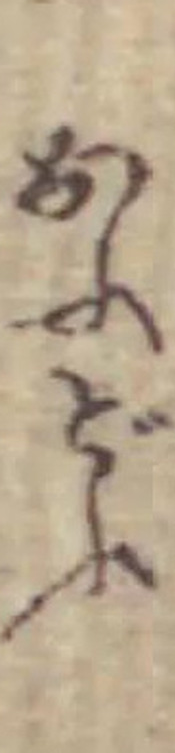おふどふ
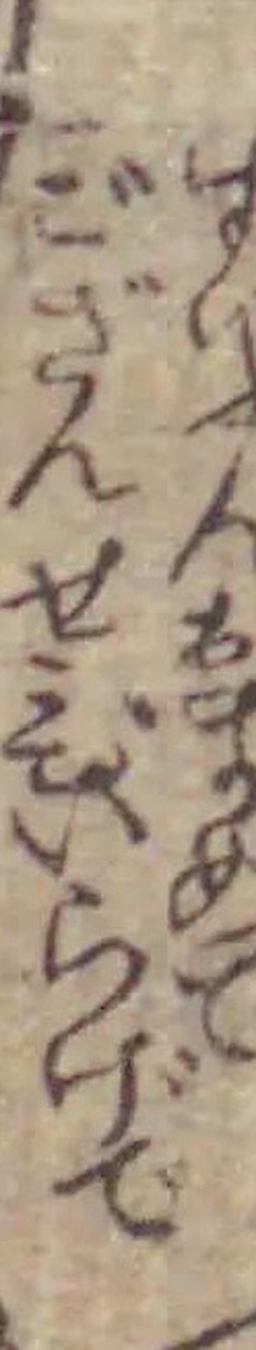ござんせひいらげで
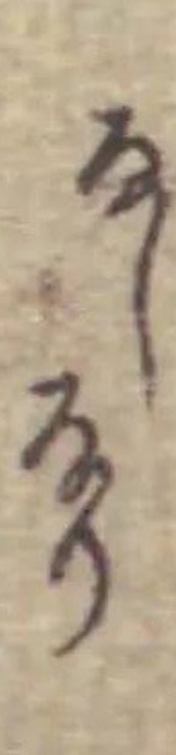なしなり
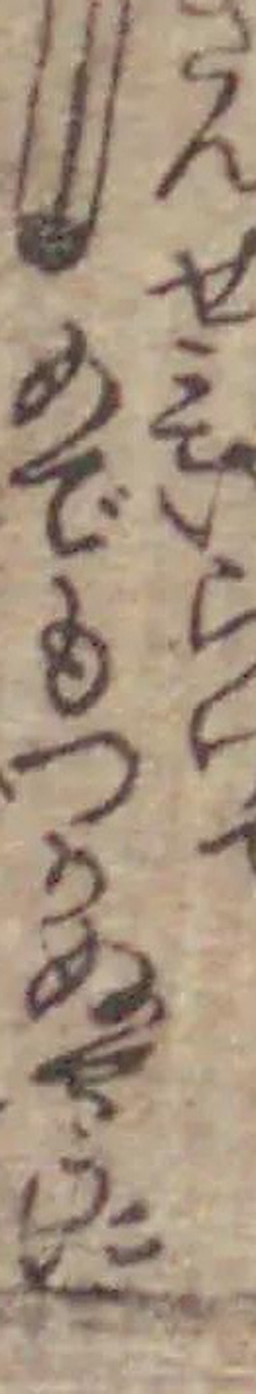めでもつかぬやうに
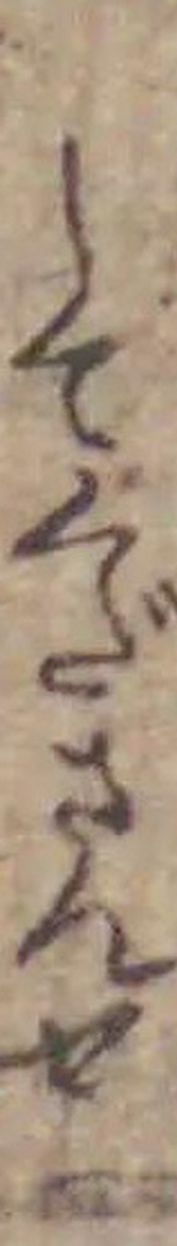してくださんせ
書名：桃太郎元服姿 2巻
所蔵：国立国会図書館 National Diet Library, JAPAN
